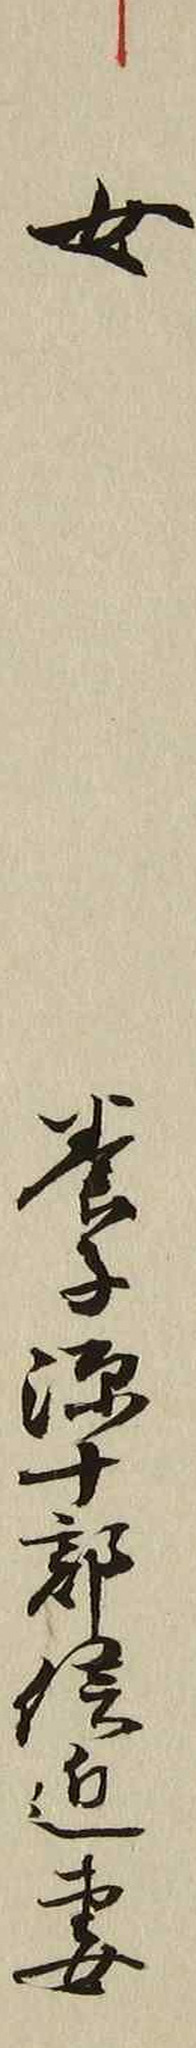女養子源十部信近妻
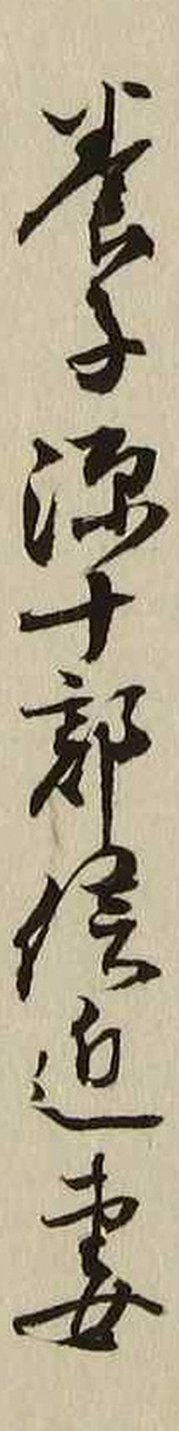女養子源十部信近妻
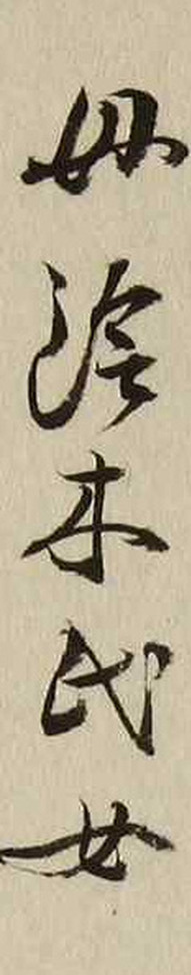母鈴木氏女

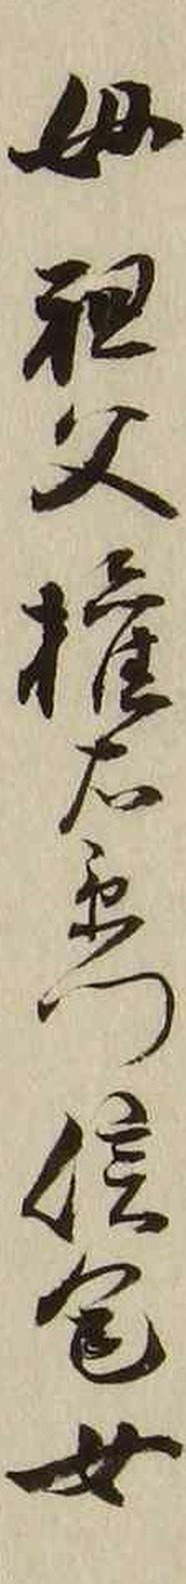母祖父権右衛門信包女
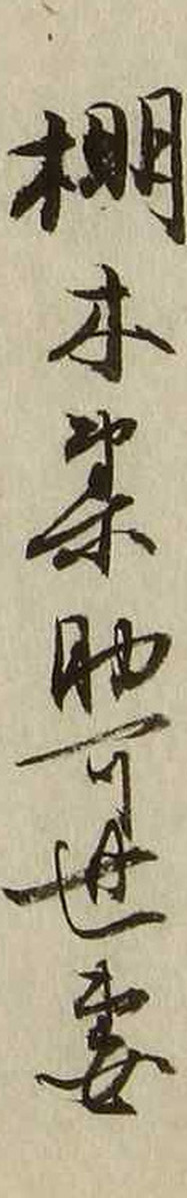棚木柔助可世妻
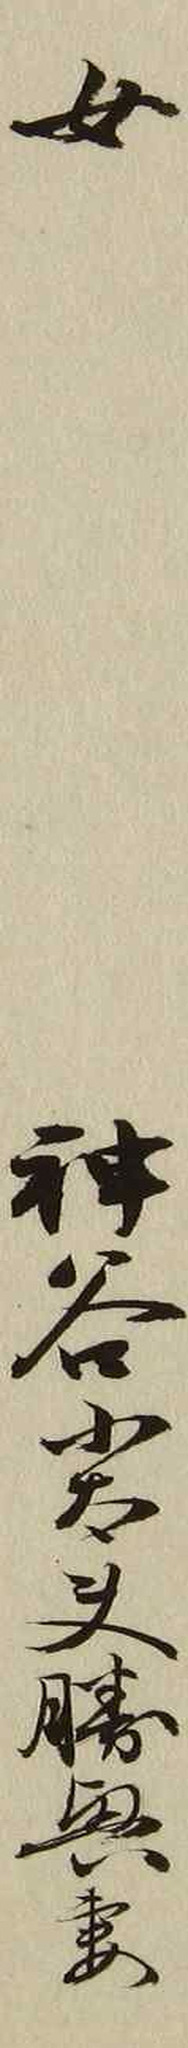女神谷小太夫勝興妻
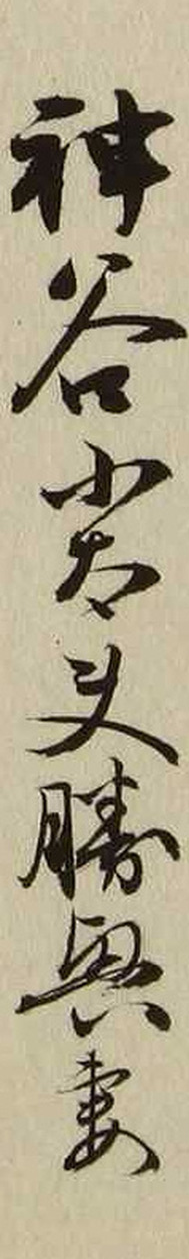女神谷小太夫勝興妻
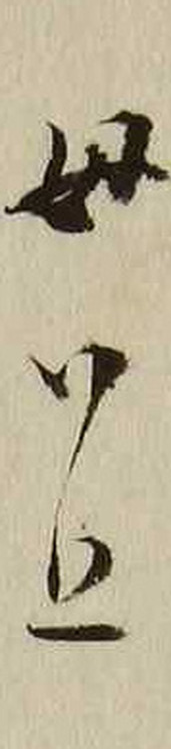母同上
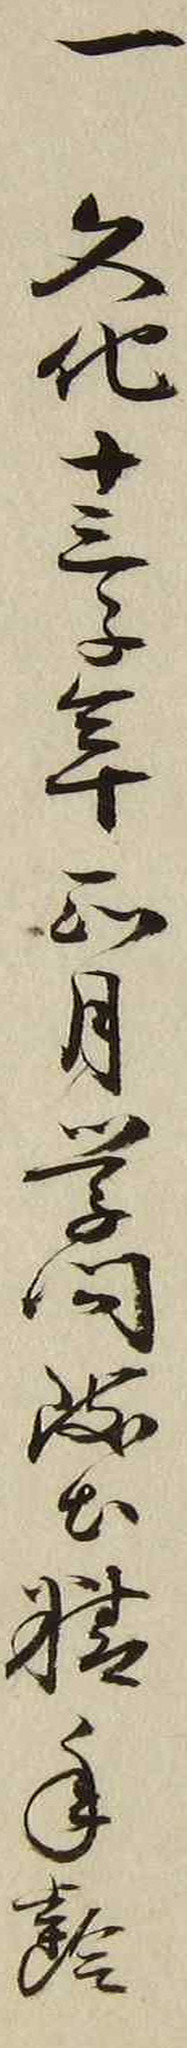一文化十三子年正月学問致出精年齢
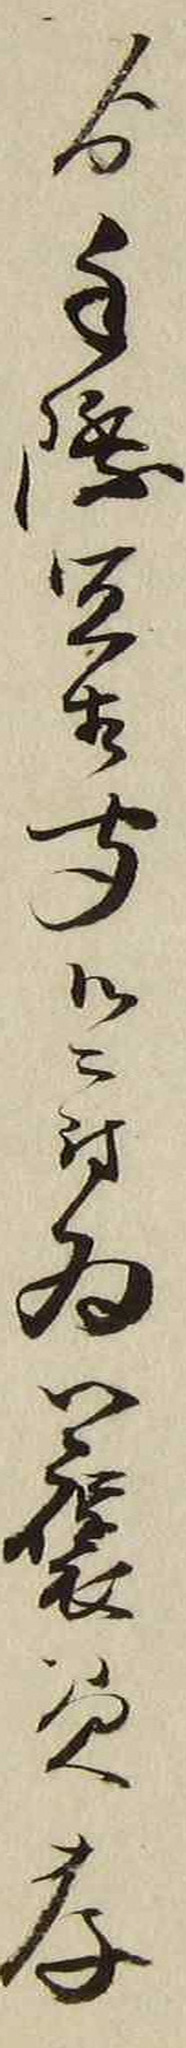ゟ手際宜相聞候ニ付為御褒美孝
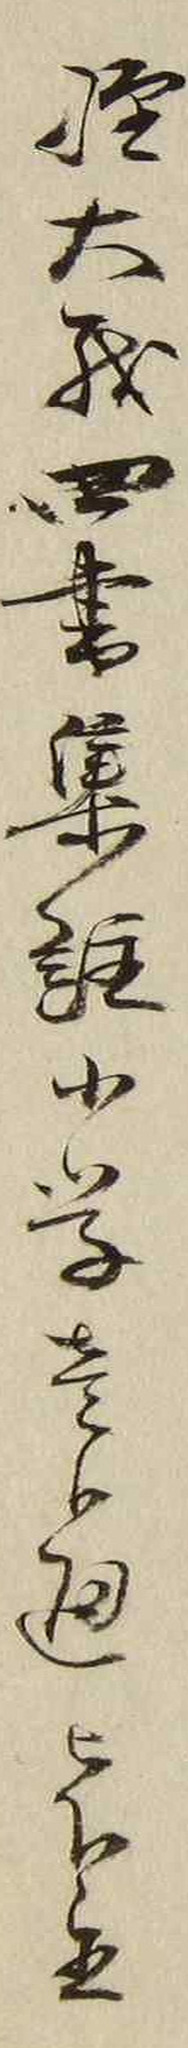経大義四書集註小学壱ト通被下置

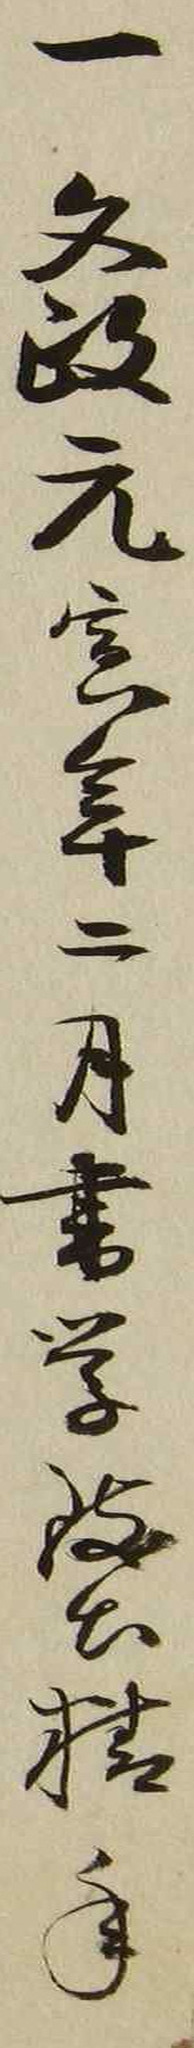一文政元寅年二月書学致出精年
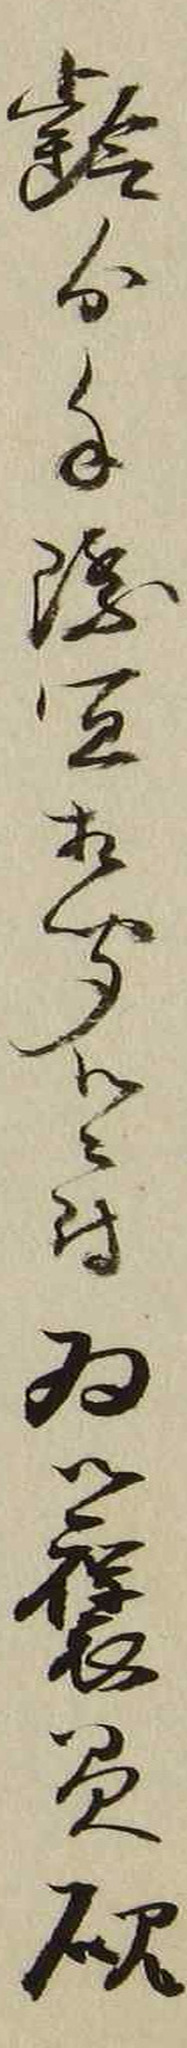齢ゟ手際宜相聞候ニ付為御褒美硯
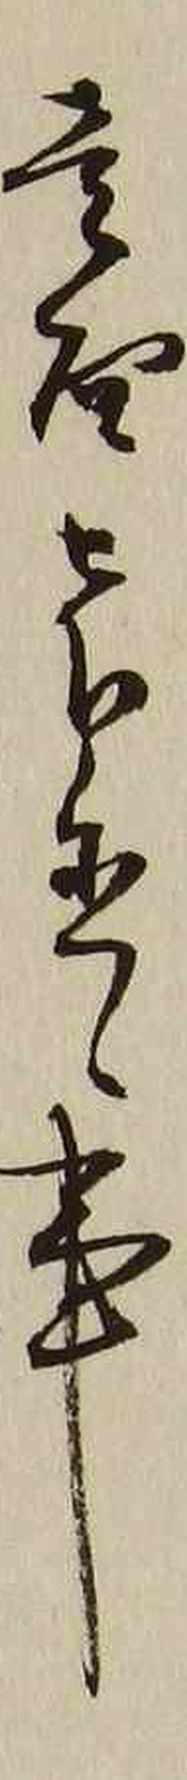壱面被下置候事
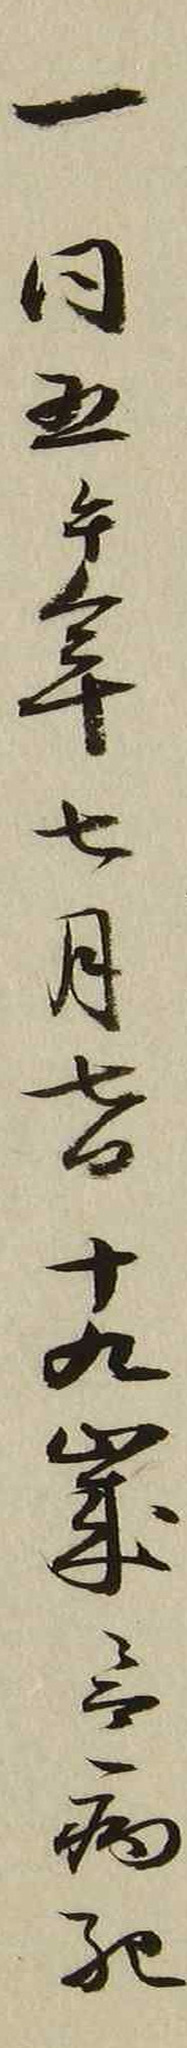一同五午年七月七日十九歳ニ而病死
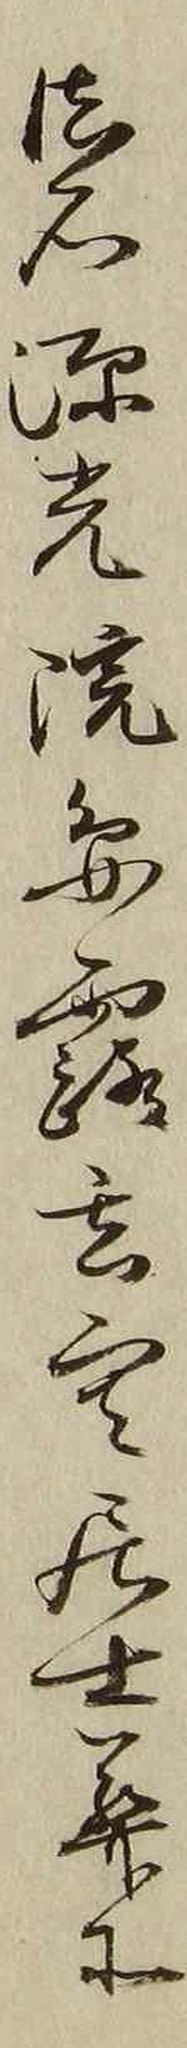法名源光院円露玄空居士葬所
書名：諸士系譜　巻之291　さ之部23
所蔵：会津若松市立会津図書館
